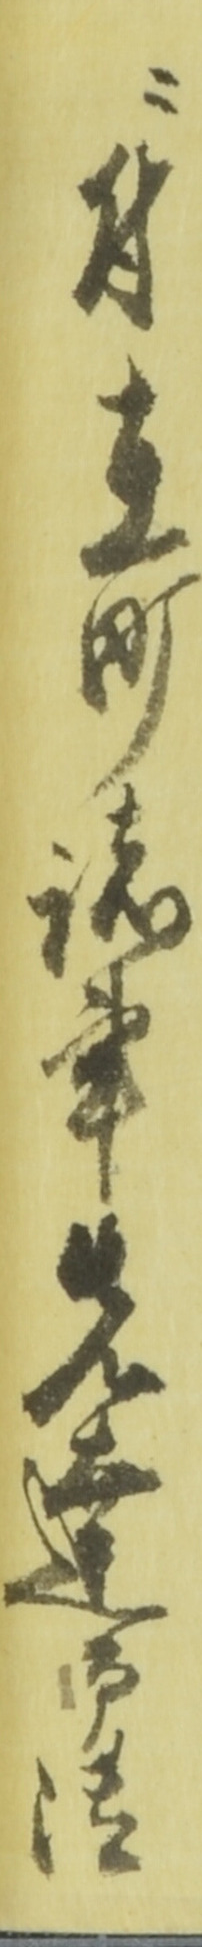ニ付在町諸事先達而御
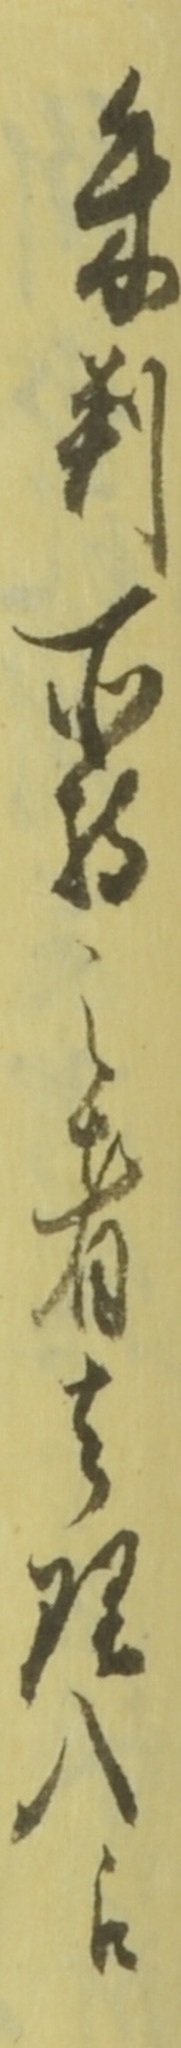朱判所持之者は理八江
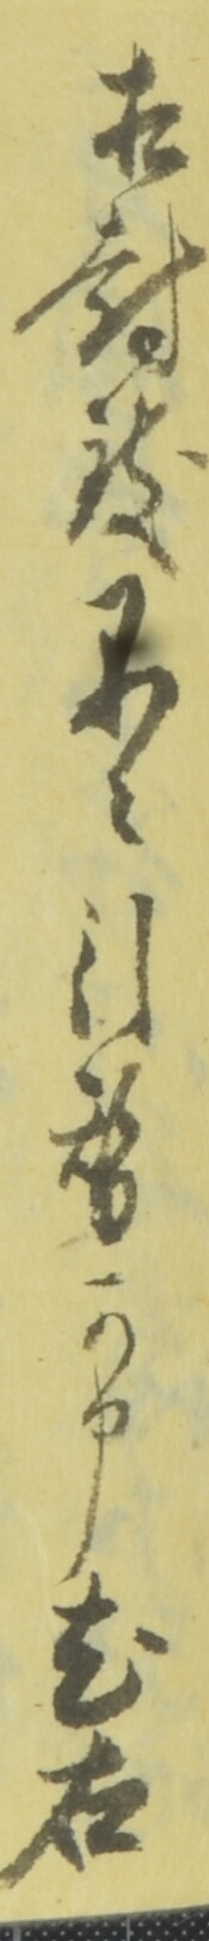相封致早々引替可申尤右
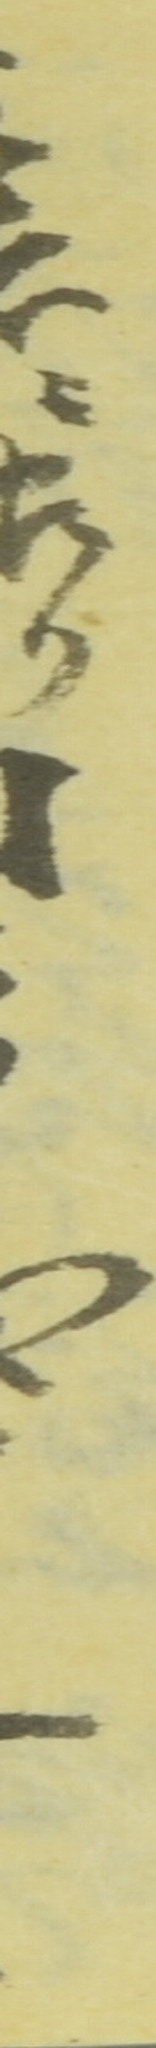之者ニ限り引替り儀ニは無之

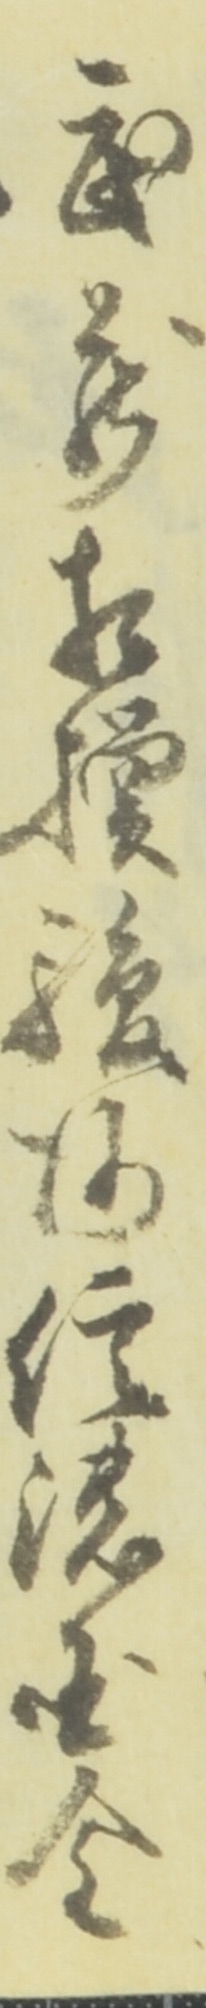武蔵相模駿河信濃国金
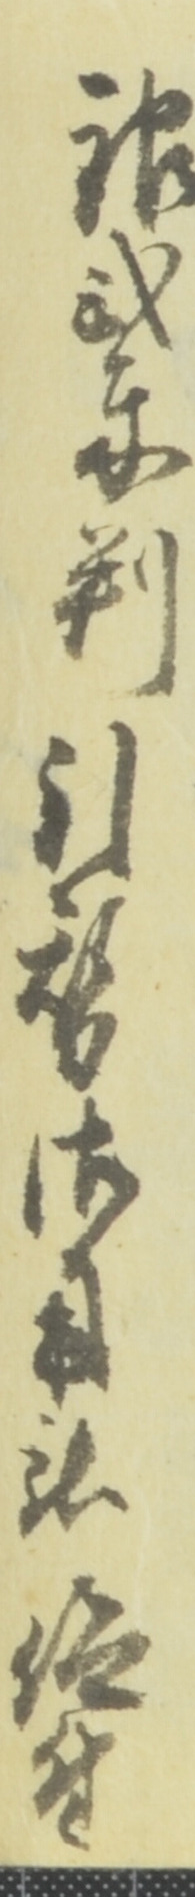銀弐朱判引替御用被仰付
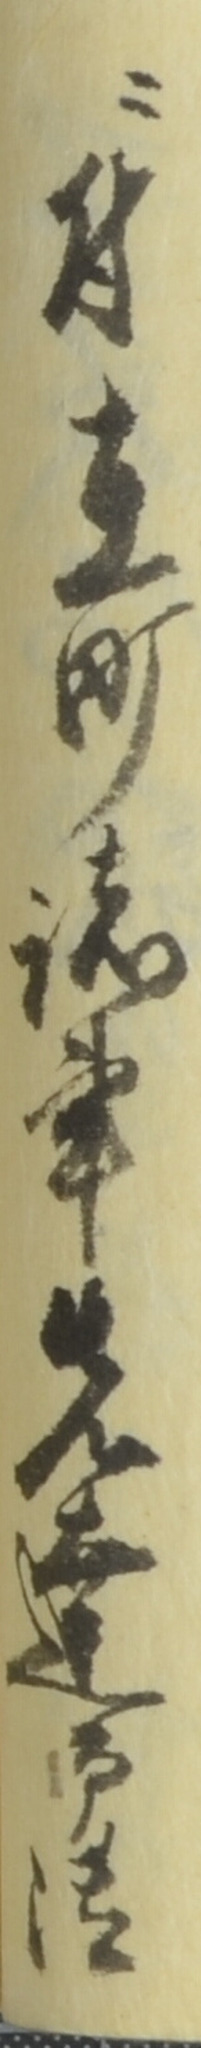ニ付在町諸事先達而御
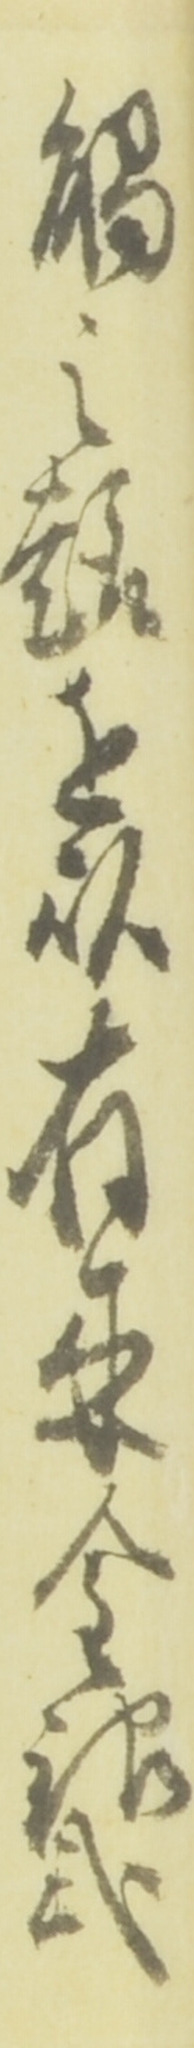触之趣を以有来金銀弐
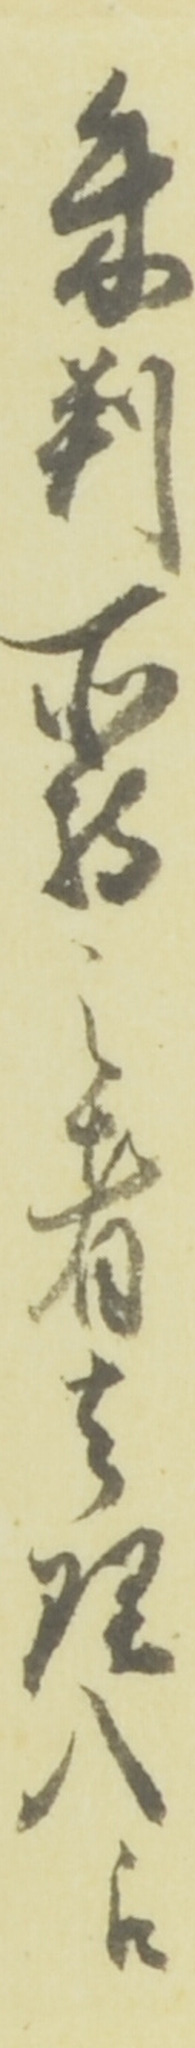朱判所持之者は理八江
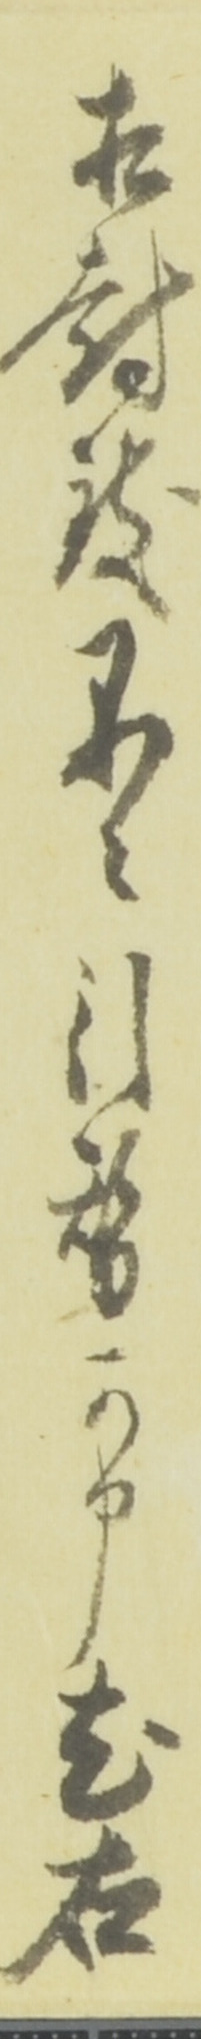相封致早々引替可申尤右
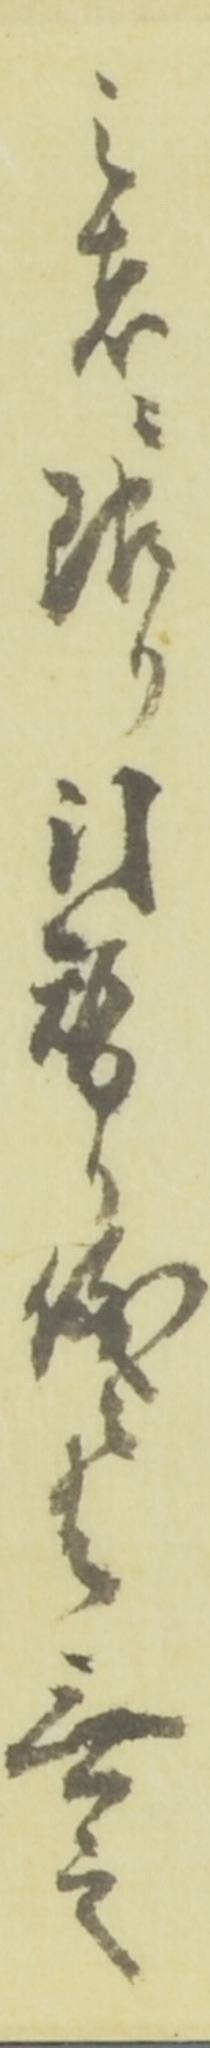之者ニ限り引替り儀ニは無之
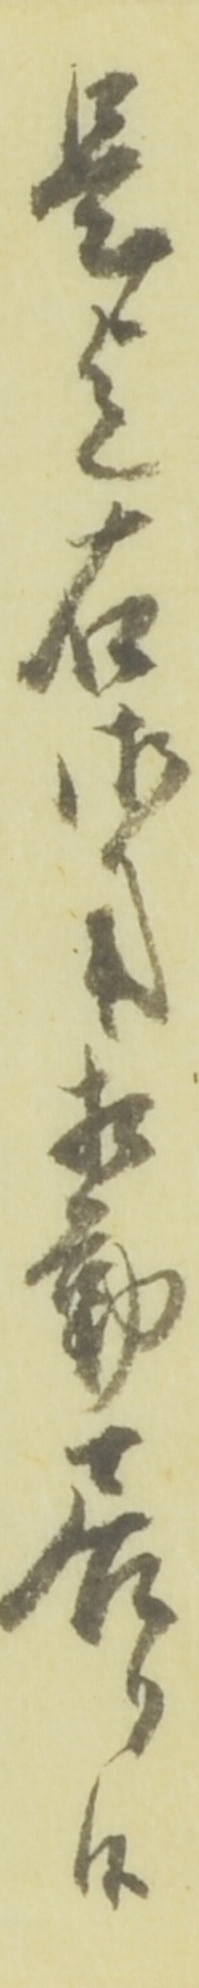是迄右御用相勤居り候
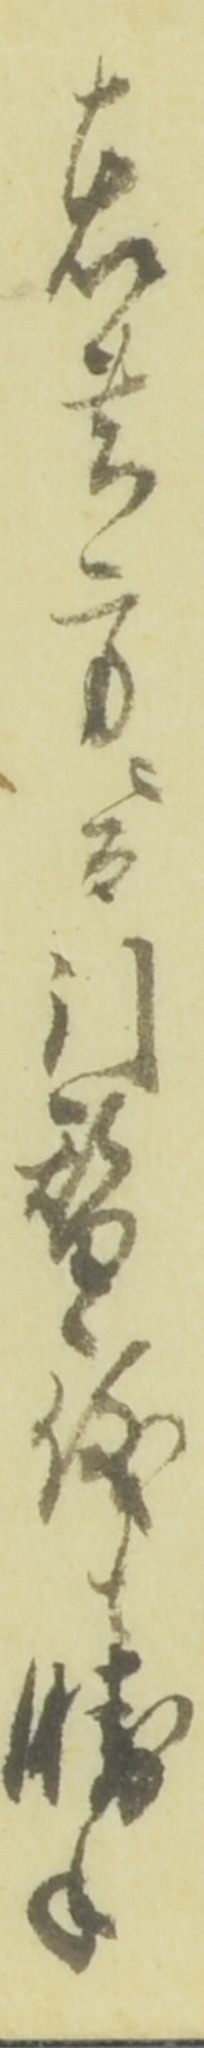者共方ニ而引替候儀も勝手
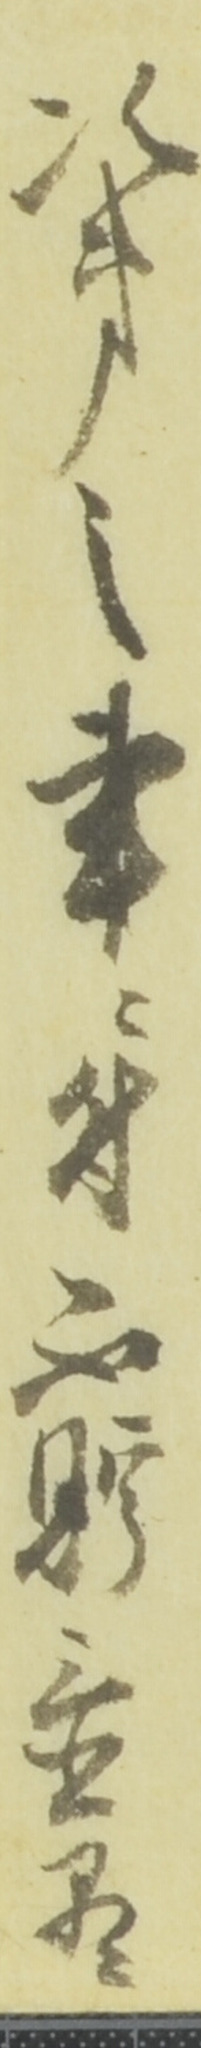次第之事ニ付不貯置早々
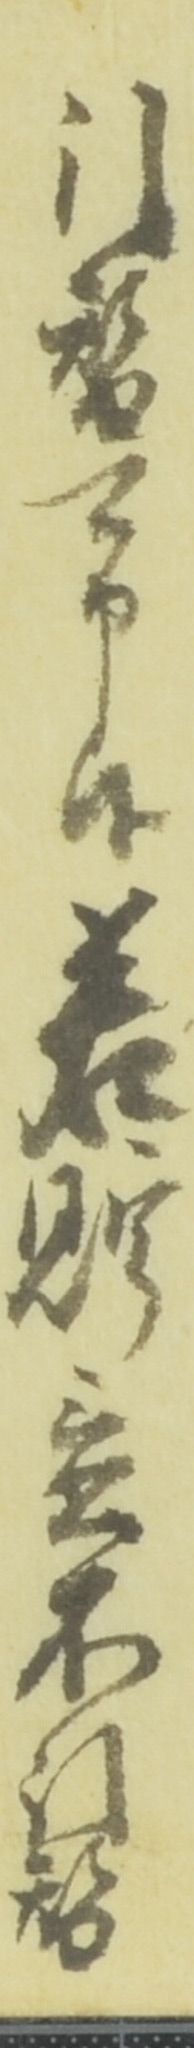引替可申候若貯置不引替
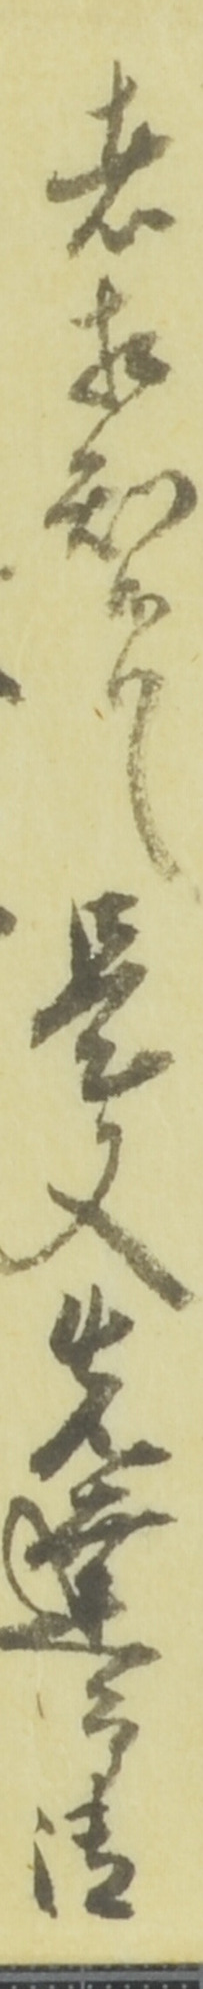者相知候ハヽ是又先達而御
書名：御触書御書附控
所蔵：伊那市立高遠町図書館・合同会社AMANE
